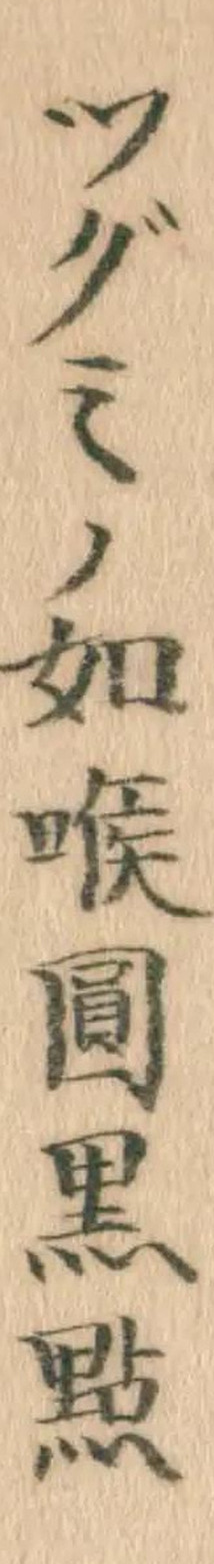ツグミノ如圓黒點
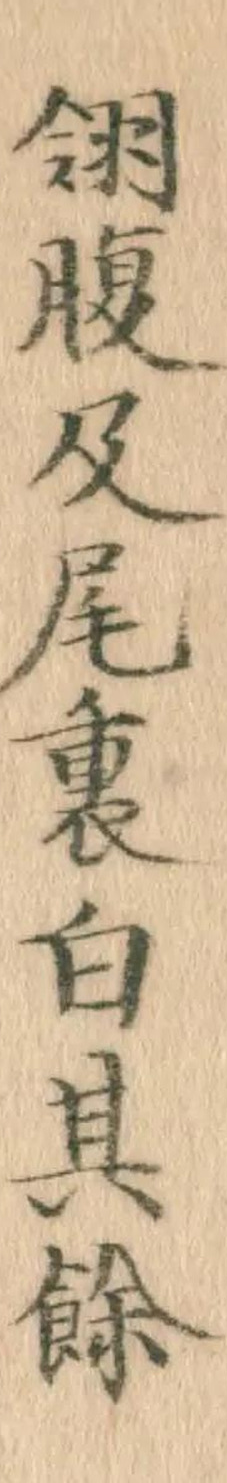翎腹及尾裏白其餘
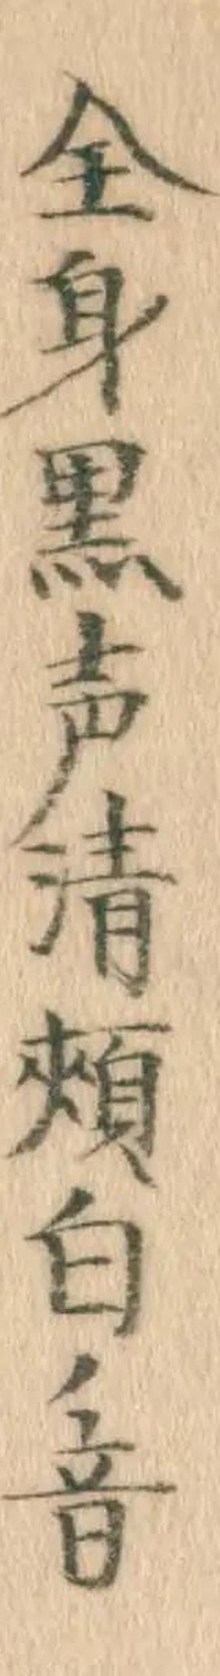全身黒声清頬白ノ音
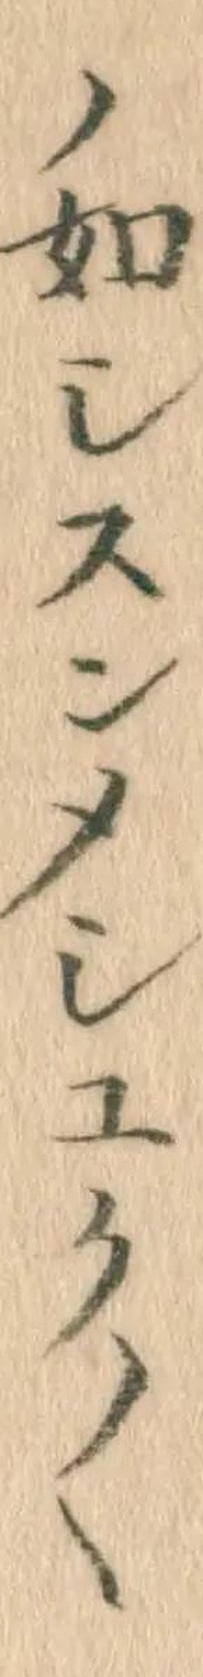ノ如シスンシテユク〱
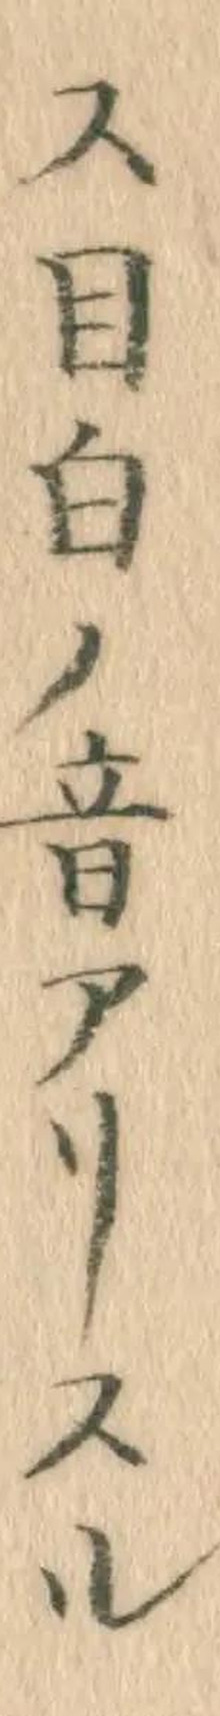ス目白ノ音アリスル
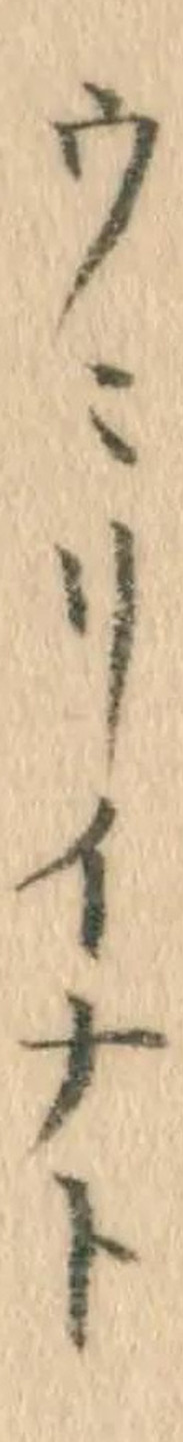ウ〃リイナト

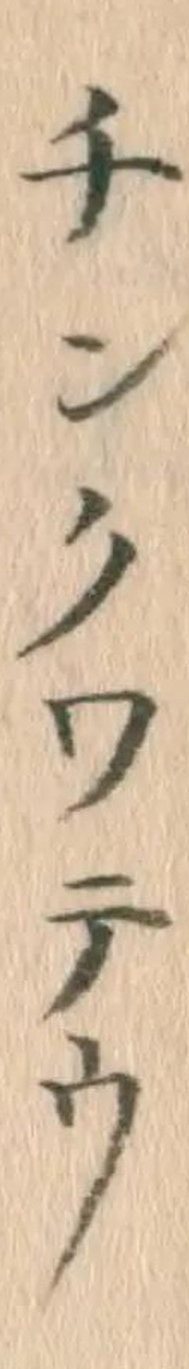チンクワテウ

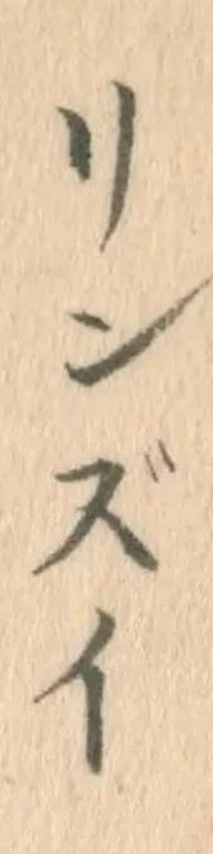リンズイ
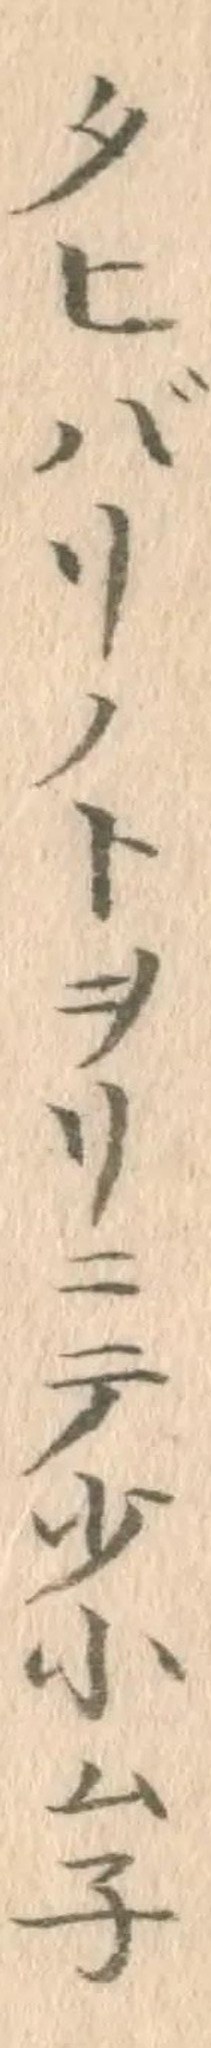タヒバリノトヲリニテス少小ム子
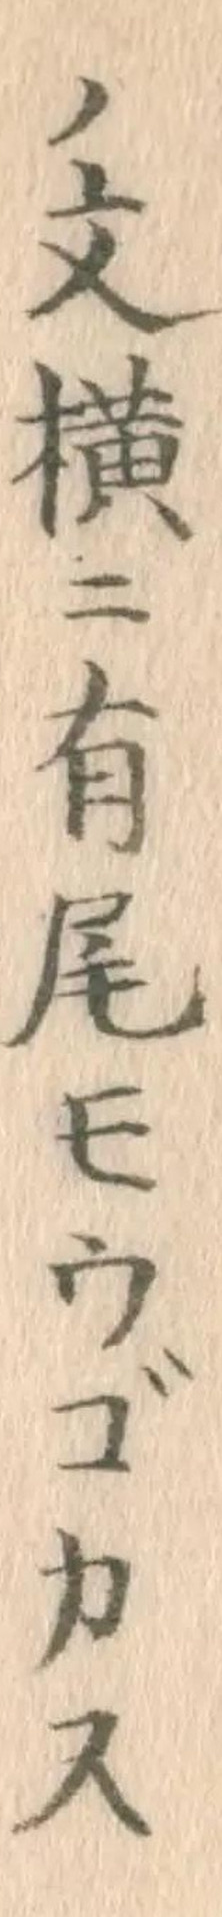ノ文横ニ有尾モウゴカス
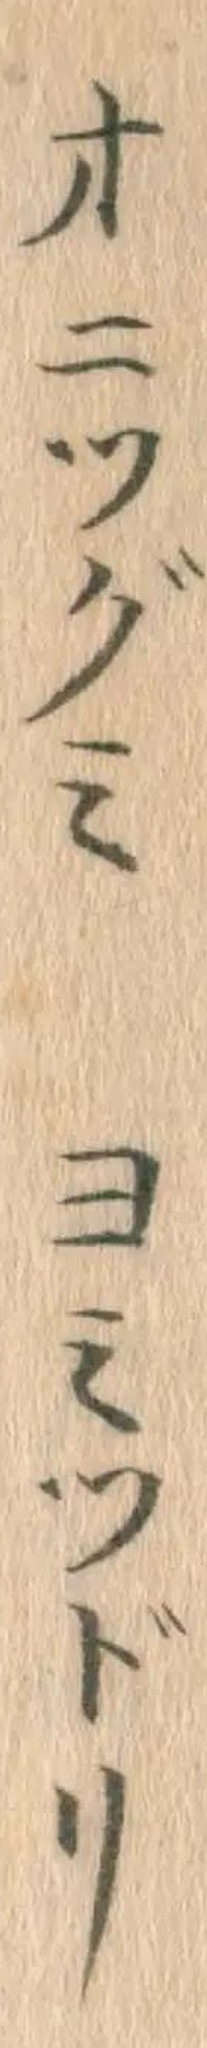オニツグミヨミツグミ
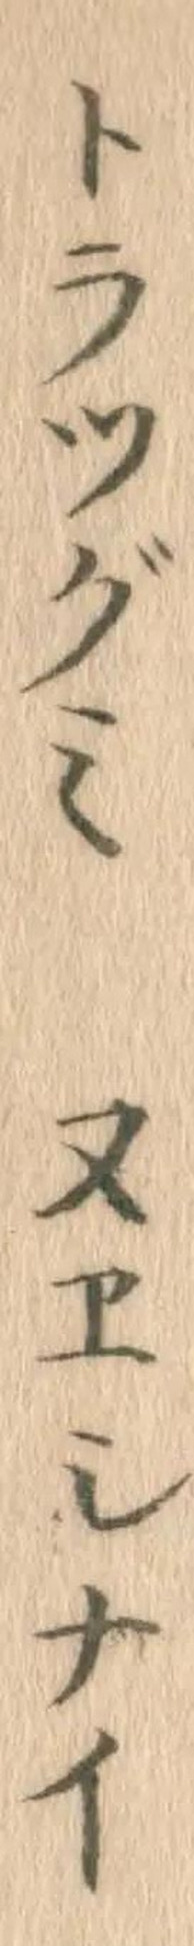トラツグミヌエシナイ
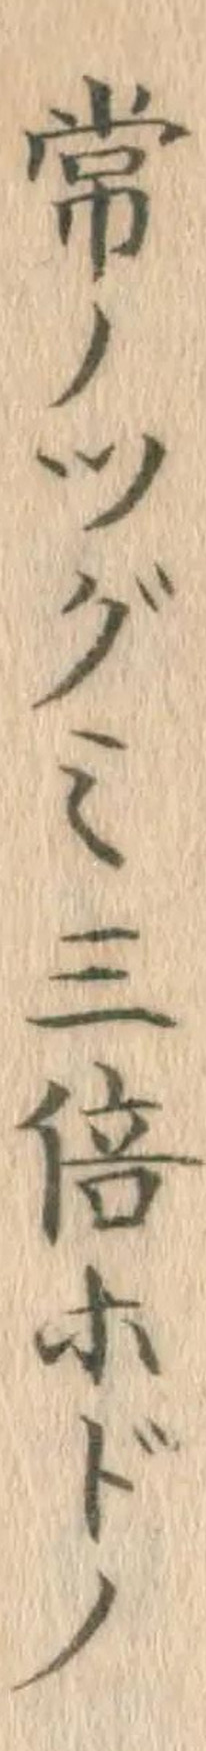常ノツグミ三倍ホドノ
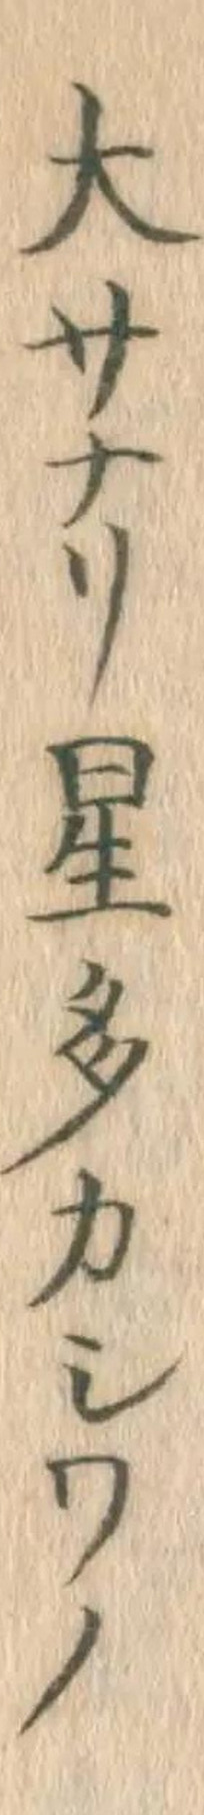大サナリ星多カシワノ
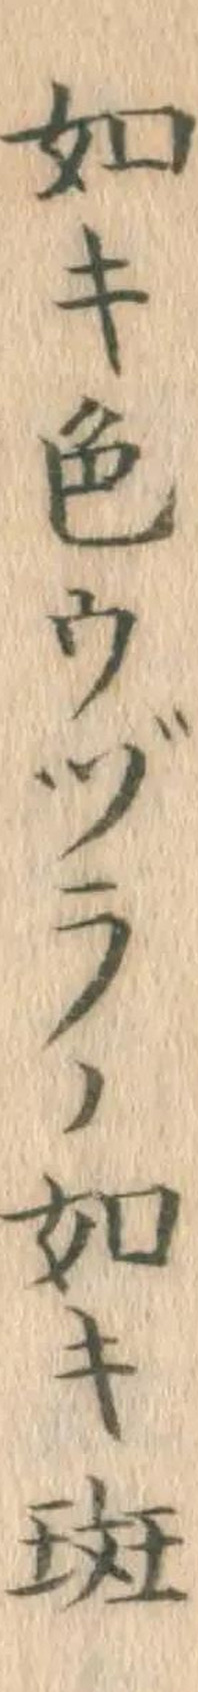如キ色ウヅラノ如斑
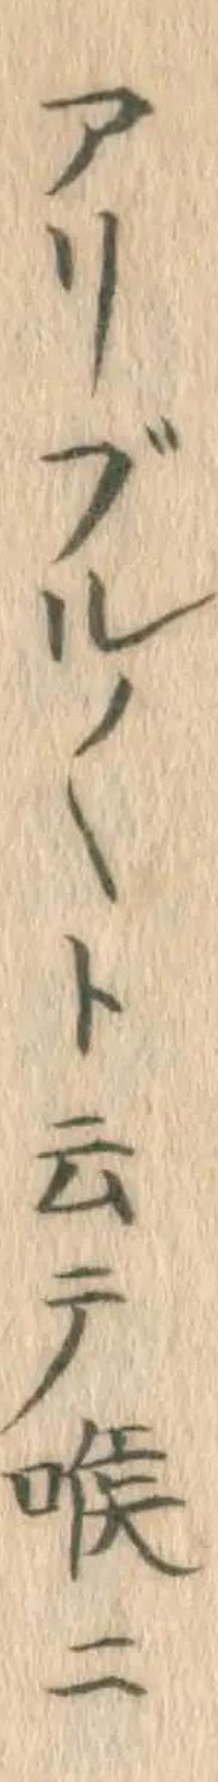アリブル〱ト云テ喉ニ
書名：水谷禽譜. [2]
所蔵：国立国会図書館 National Diet Library, JAPAN
